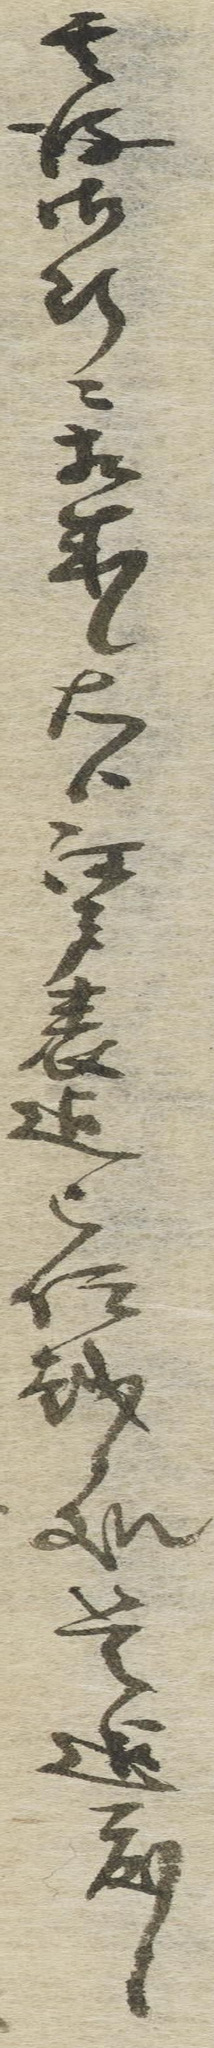其後御改二相成候右ハ江戸表迄被仰越候処是迄度々
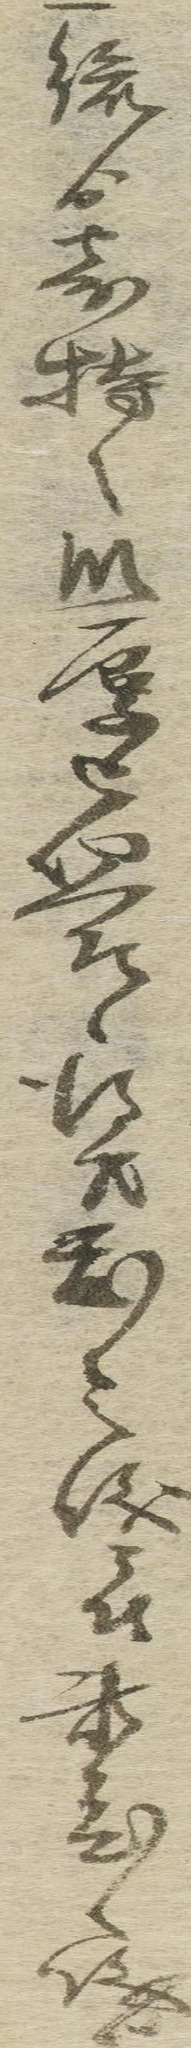一統ゟ奇特之段厚可被思召候得共度々儀二付此度之儀ハ

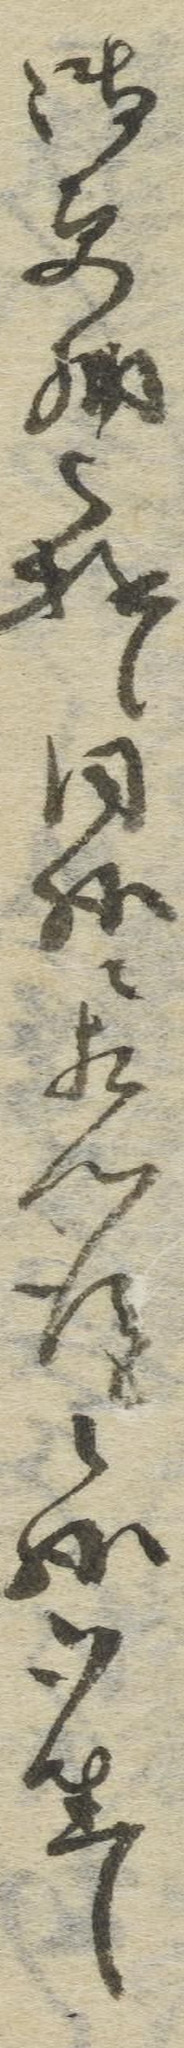御受納被遊候同様二相心得候様御坐候
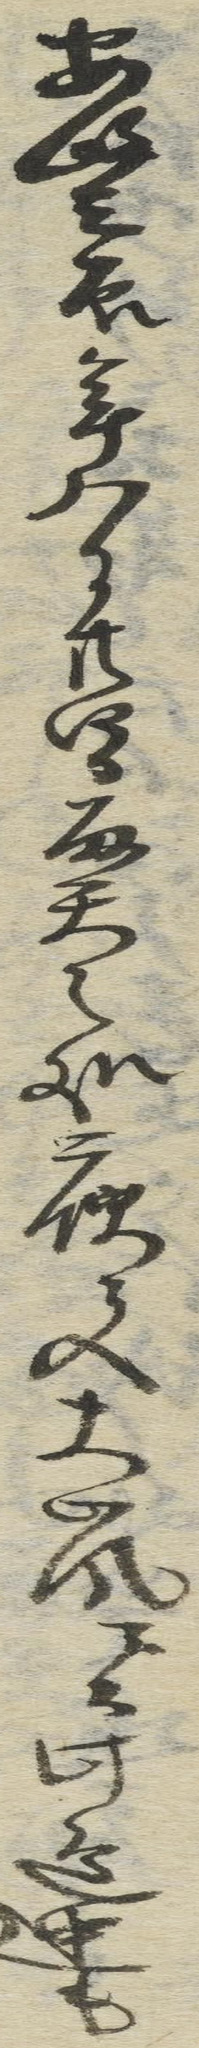安政三辰年八月廿四日雨天之処夜二入大嵐二而此辺迚も
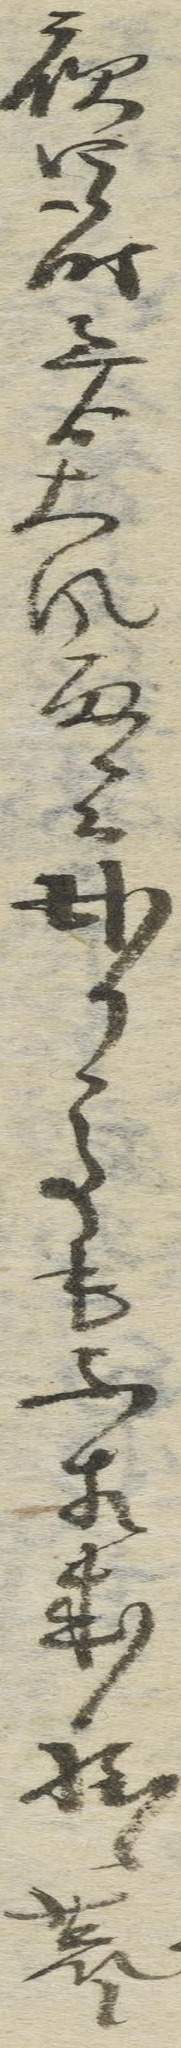夜四ツ時過ゟ大風雨二而臥り事も不相成候程荒候
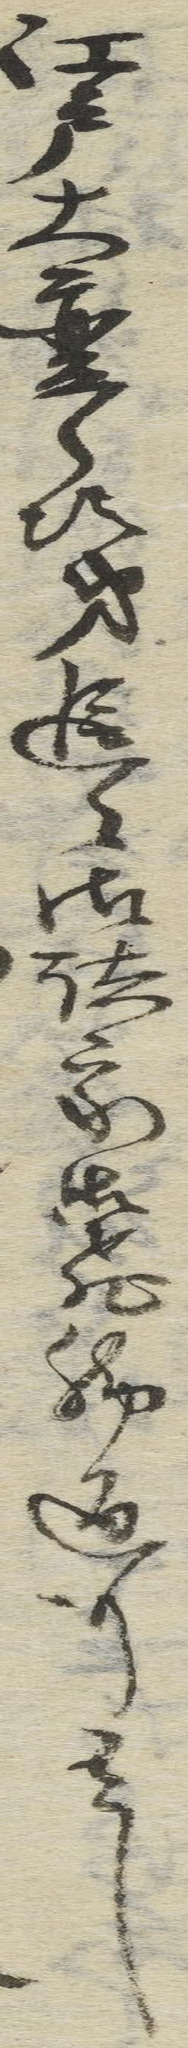江戸大変之次第追々御諸家御飛脚通行有之
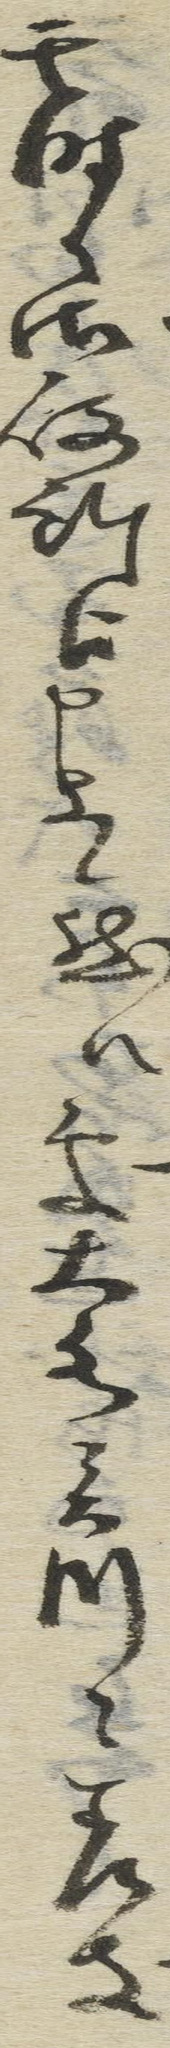其時々御役所江申上候然ㇽ処大水二而川々差支
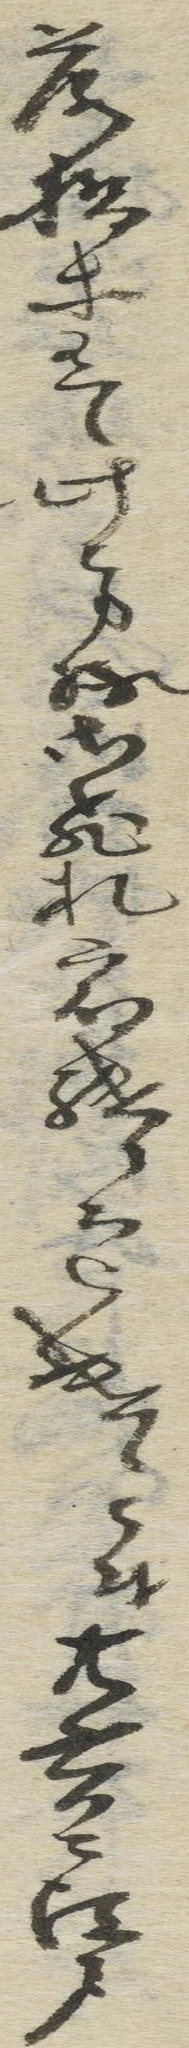落橋等有之此方様御飛札宿継二而遣候二付廿六日二江戸
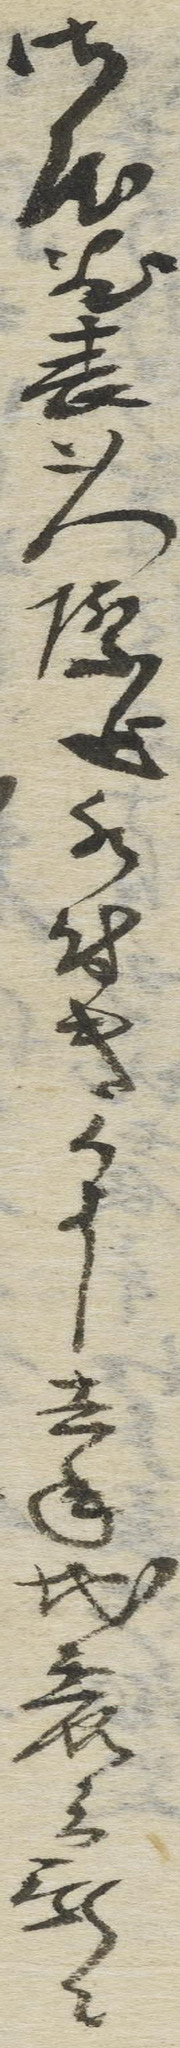御屋敷表御門際迄水付キ候よし去年地震二而新しく
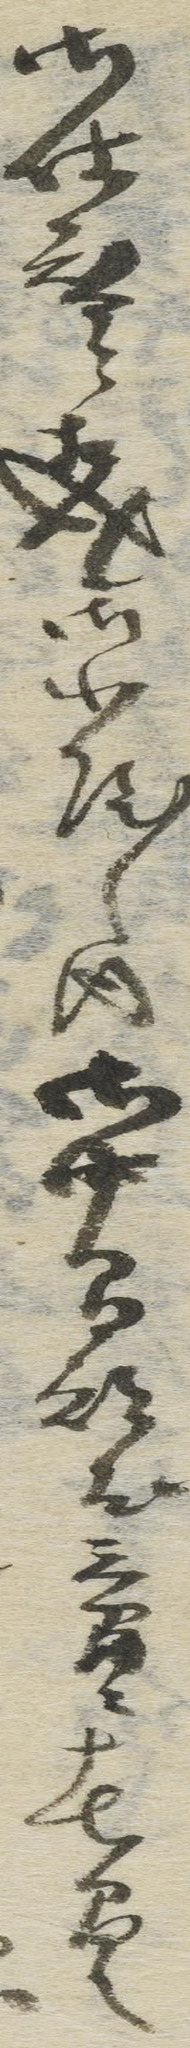御仕度二相成候御小屋之内御中間部屋三間二十七間之
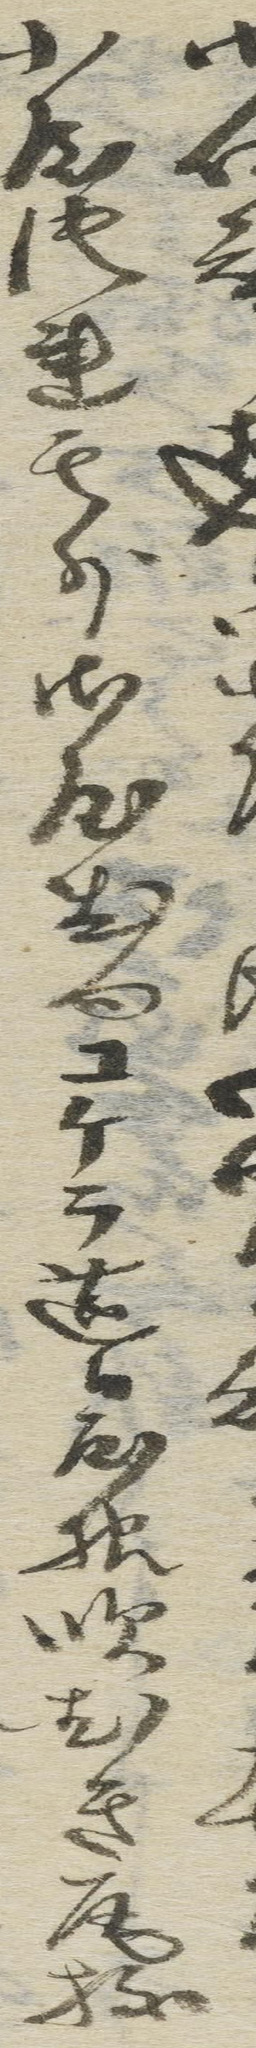小屋潰れ其外御屋敷向コケラ造候屋根吹むき瓦抔
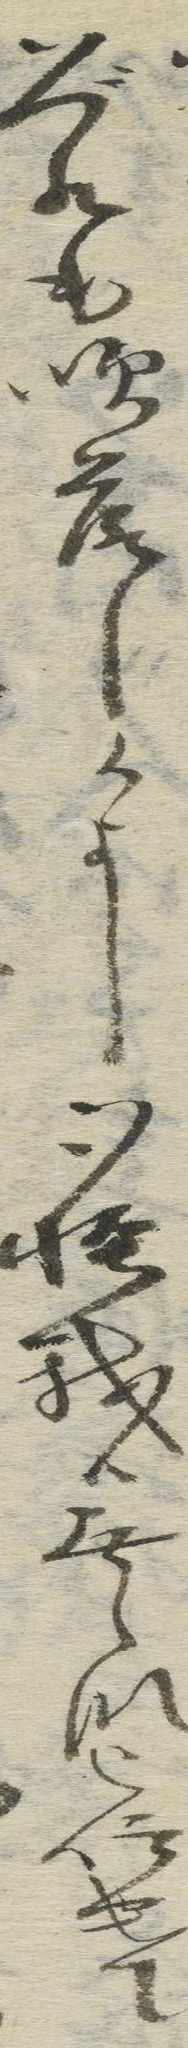いづれも吹落し候よし御怪我ハ無之段被仰遣候
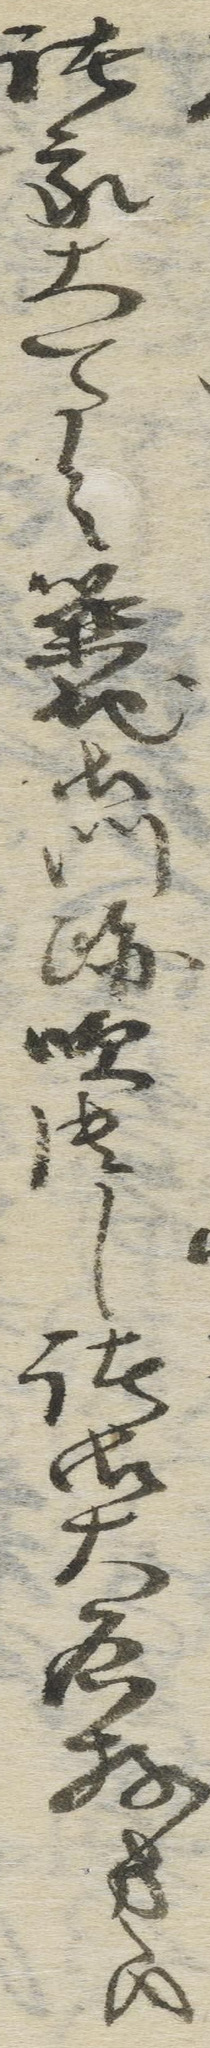諸家大いたミ築地御門跡吹潰し諸御大名様方之内
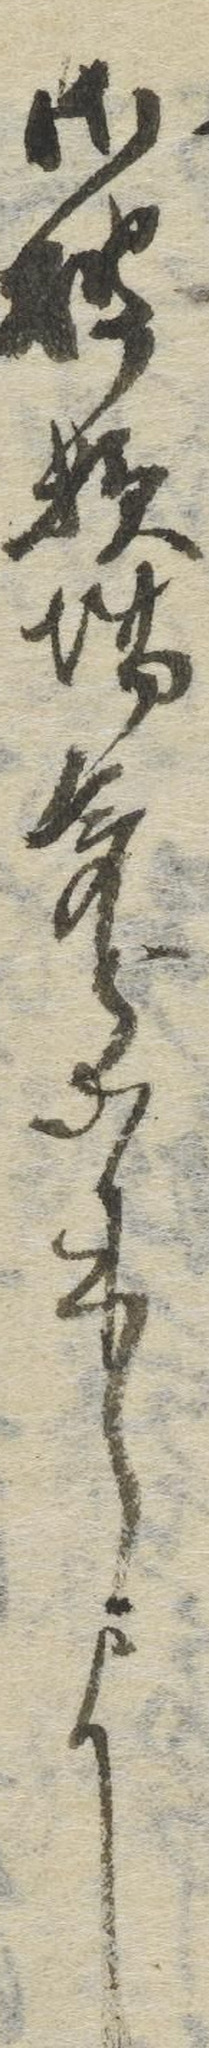御破損場多分出来候よし
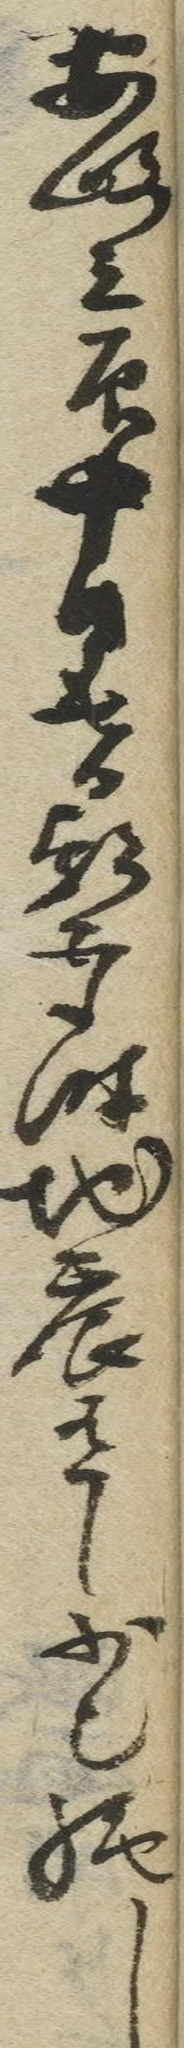安政三辰十月七日朝五ツ時地震にて少し強し
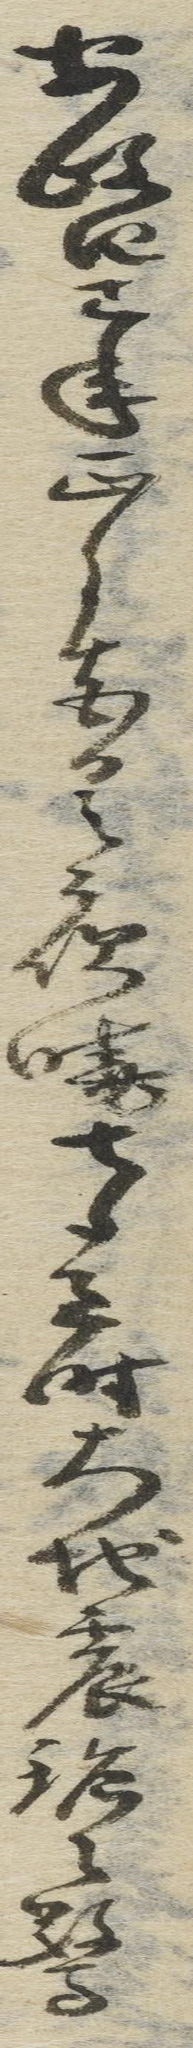安政四巳年正月十五日之夜暁七ッ過時大地震銘々驚
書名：信濃越後　地震書留
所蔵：東京大学地震研究所図書室 Earthquake Research Institute Library, The University of Tokyo, JAPAN
